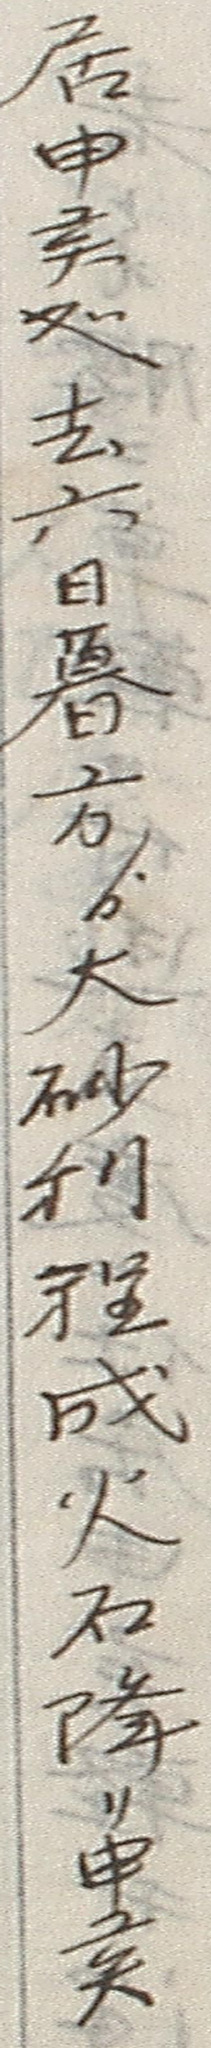居申候処去六日暮方ゟ大砂利程成火石降り申候
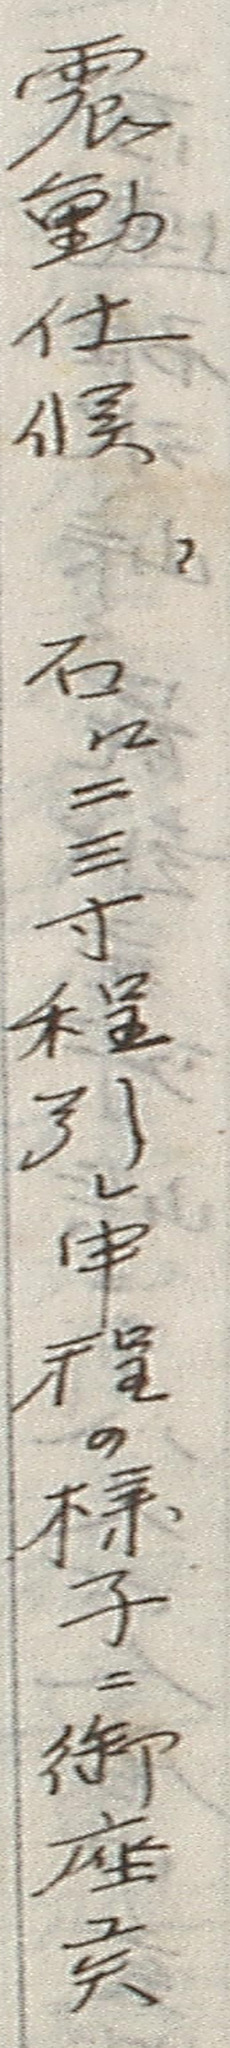震動仕候？石江二三寸程聞引ㇾ申程の様子二御座候
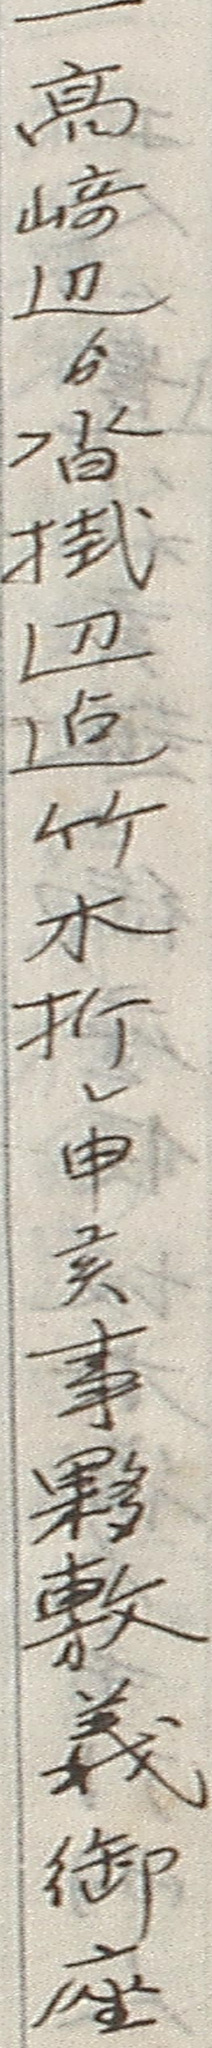一高崎辺ゟ沓掛辺迄竹木折ㇾ申候事夥敷義御座
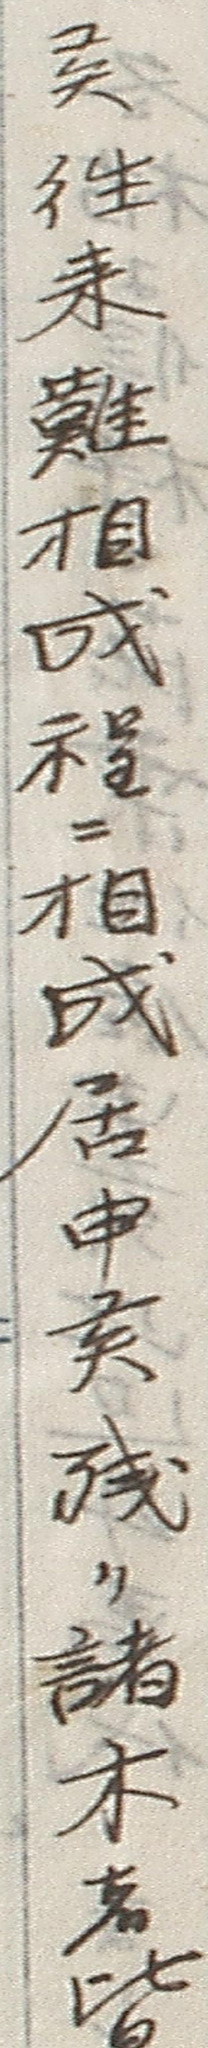候往来難相成程二相成居申候残り諸木は皆

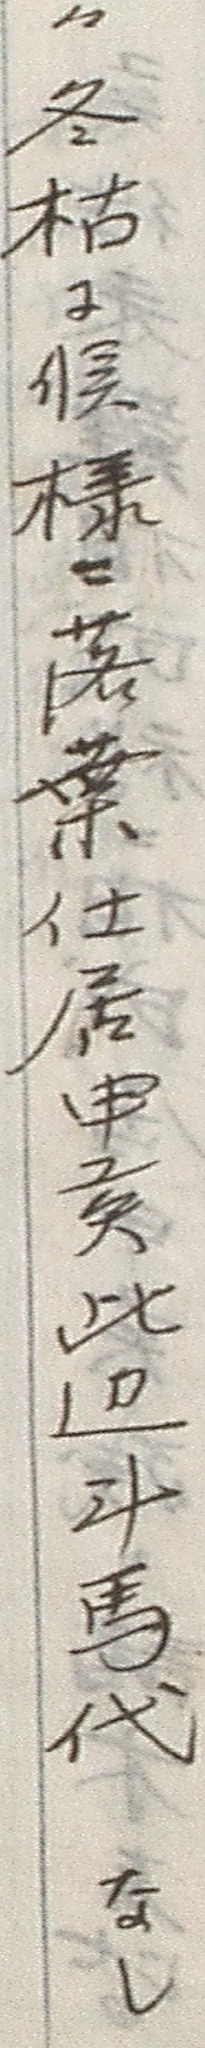々冬枯に候様二落葉仕居申候此辺馬代二なし
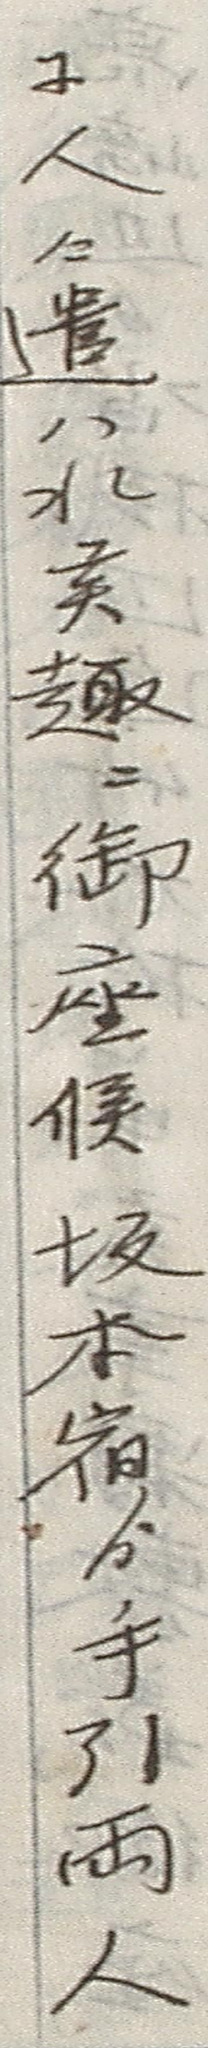に人々遣ハれ候趣二御座候坂本宿ゟ手引両人
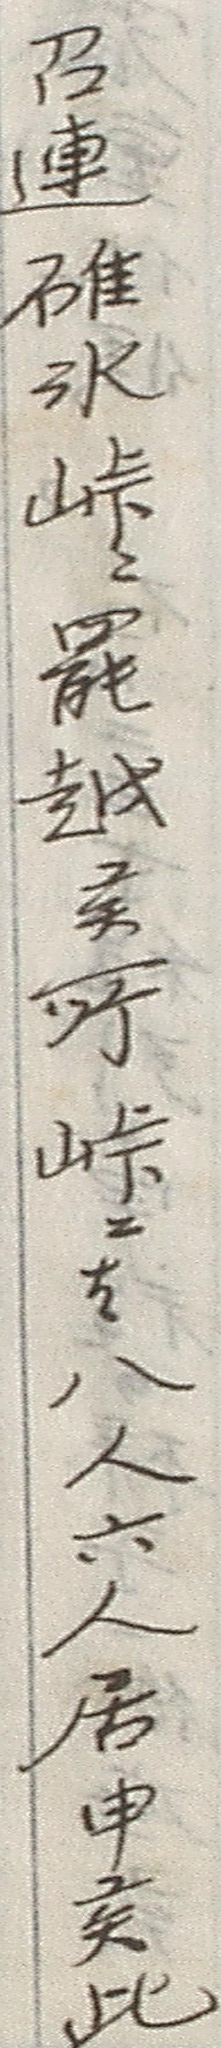召連碓井峠二罷越候所峠二は八人六人居申候此
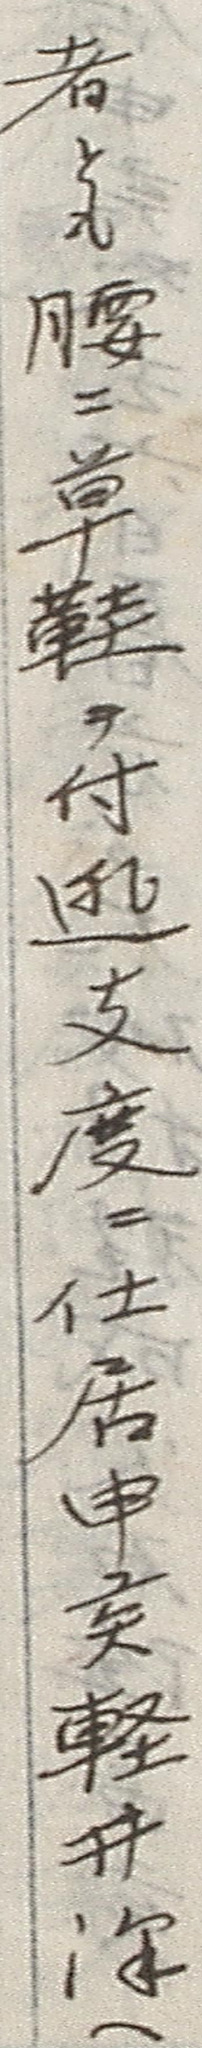者とも腰二草鞋ヲ付逃支度二仕居申候軽井沢へ
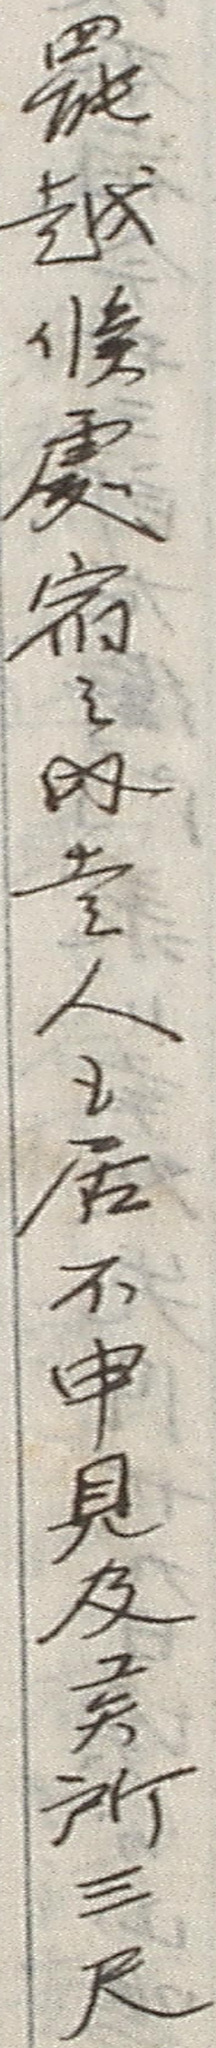罷越候処宿之内壱人も居不申見及候所三尺
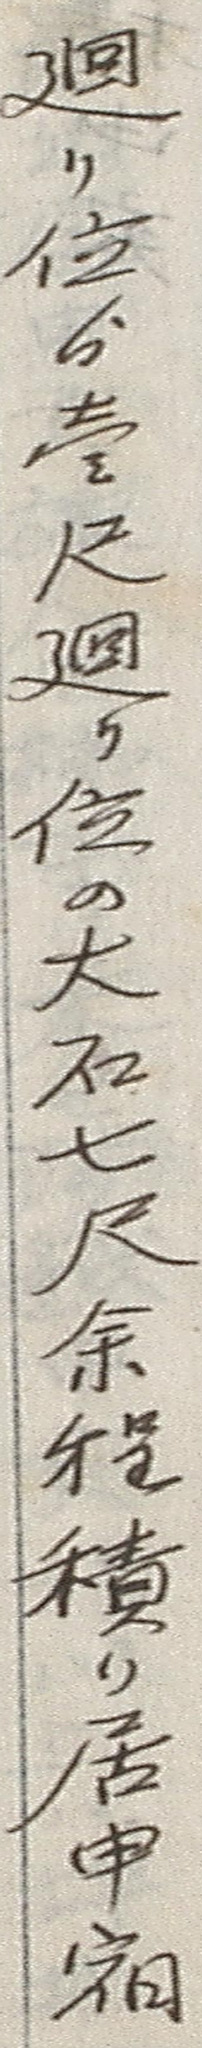廻り位ゟ壱尺廻り位の大石七尺余程積り居申宿
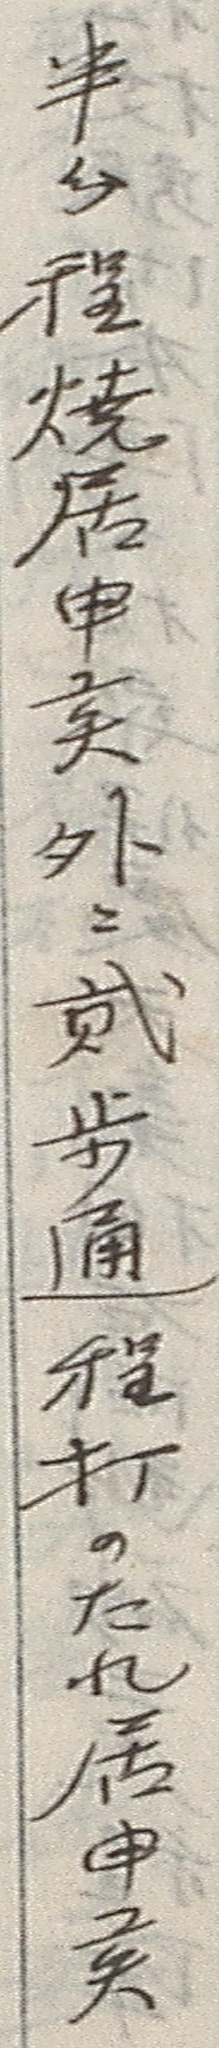半分程焼居申候外二弐歩通程打かたれ居申候
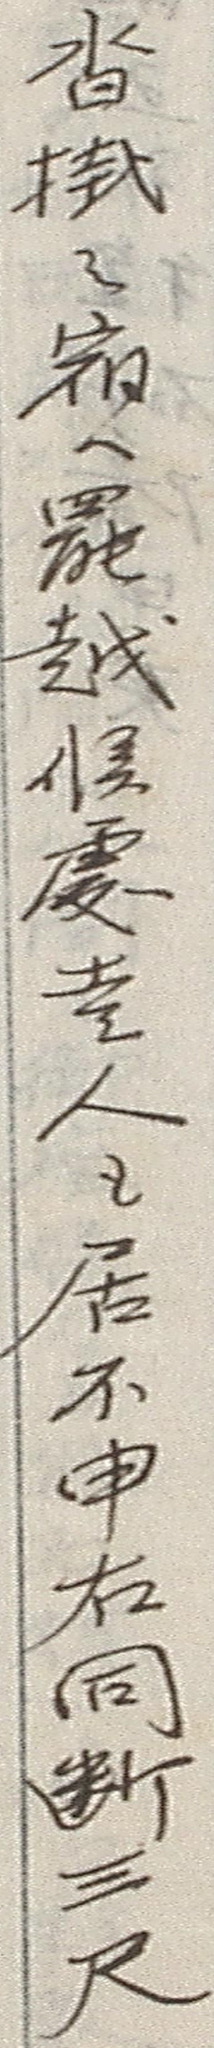沓掛之宿へ罷越候処壱人も居不申候右同断三尺
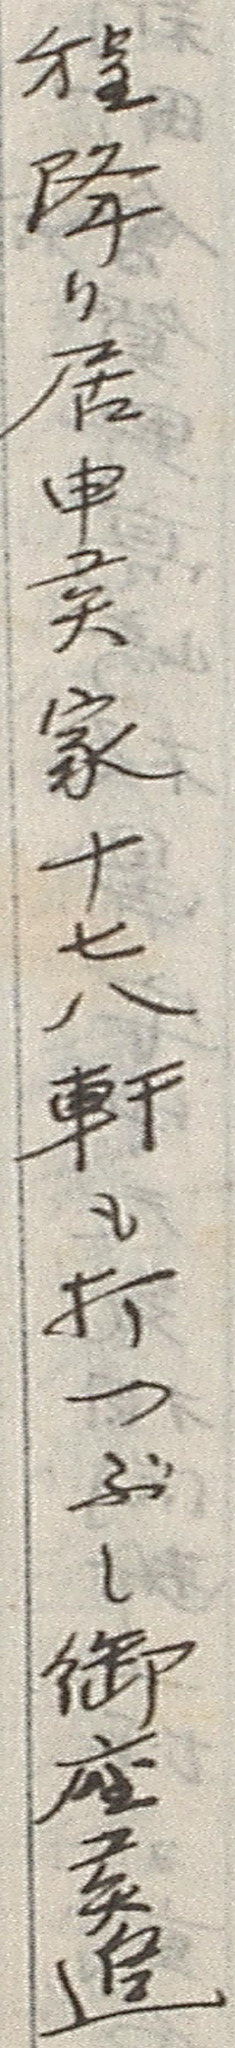程降り居申候家十七八軒も打つぶし御座候追
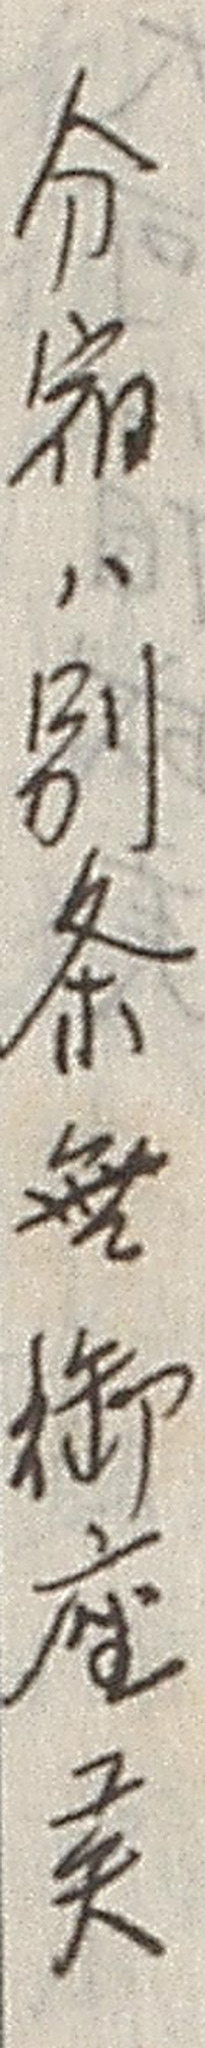分宿ハ別条無御座候
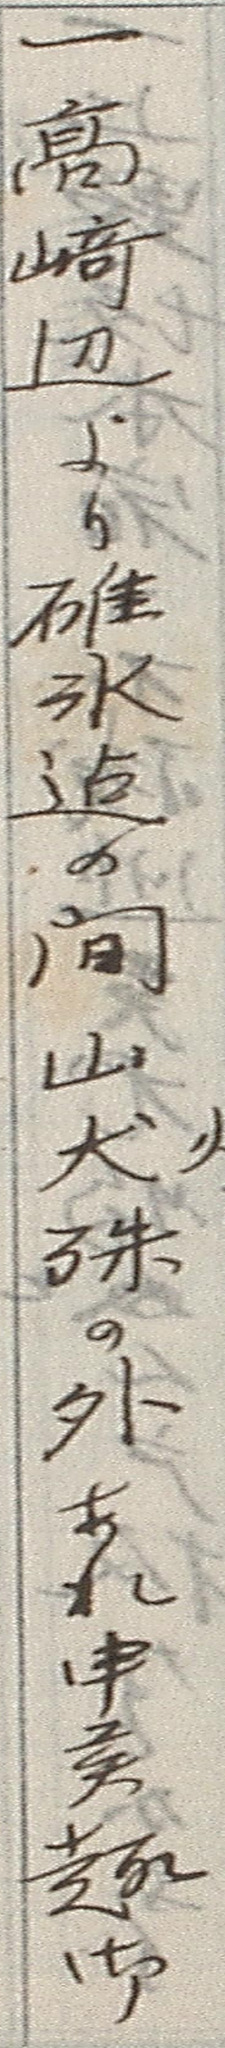一高崎辺より碓氷迄の間山犬殊の外あれ申候趣御
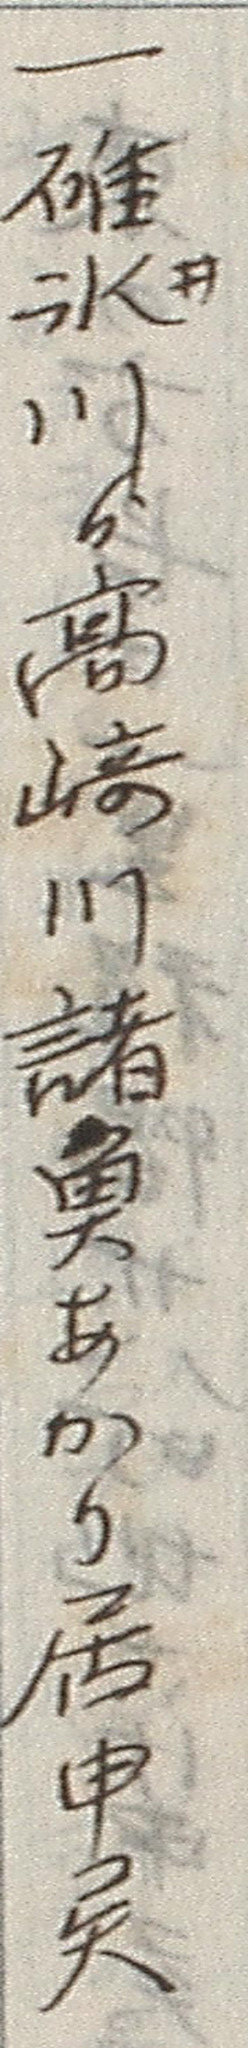一碓氷川ゟ高崎川諸魚あかり居申候
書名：浅間山焼出記
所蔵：東京大学地震研究所図書室 Earthquake Research Institute Library, The University of Tokyo, JAPAN
